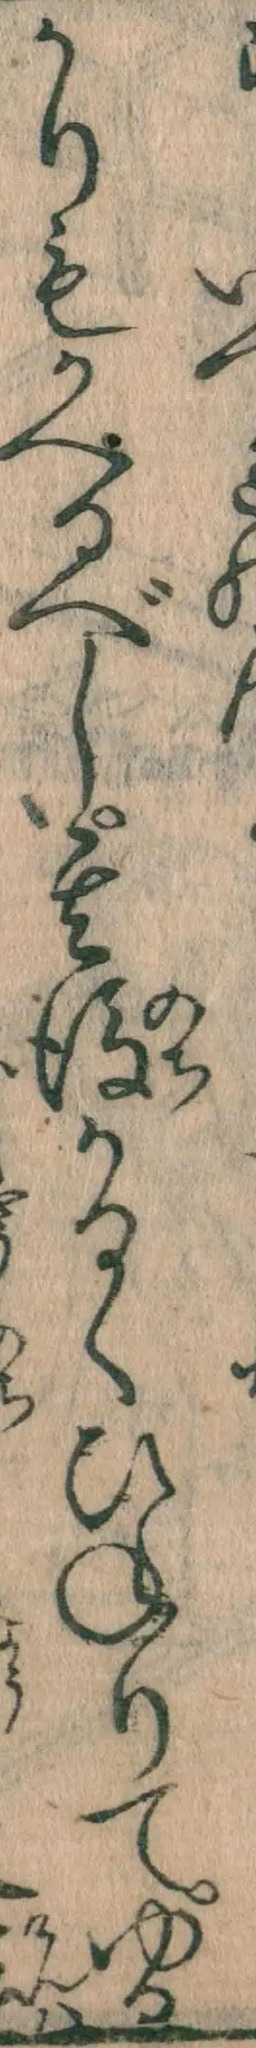かりもかへるべし。其後かるくひねりて。ゆる
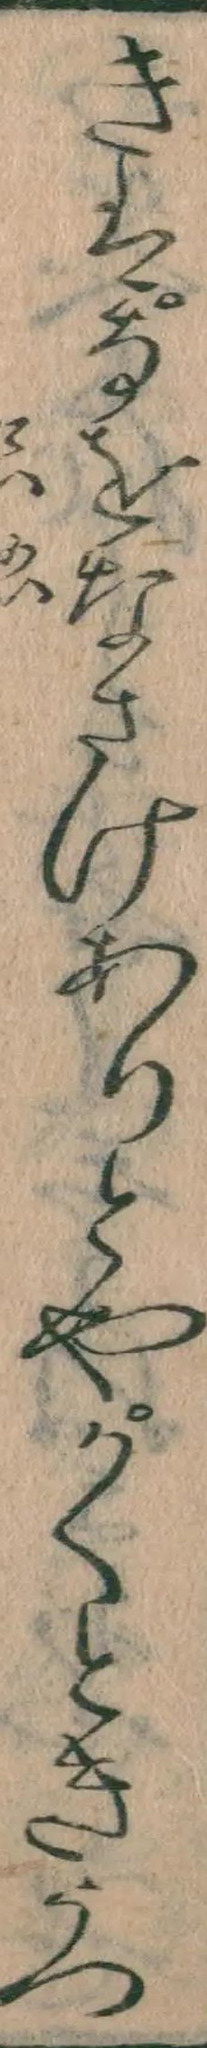きは。なをなさけありとや。かくときうつ
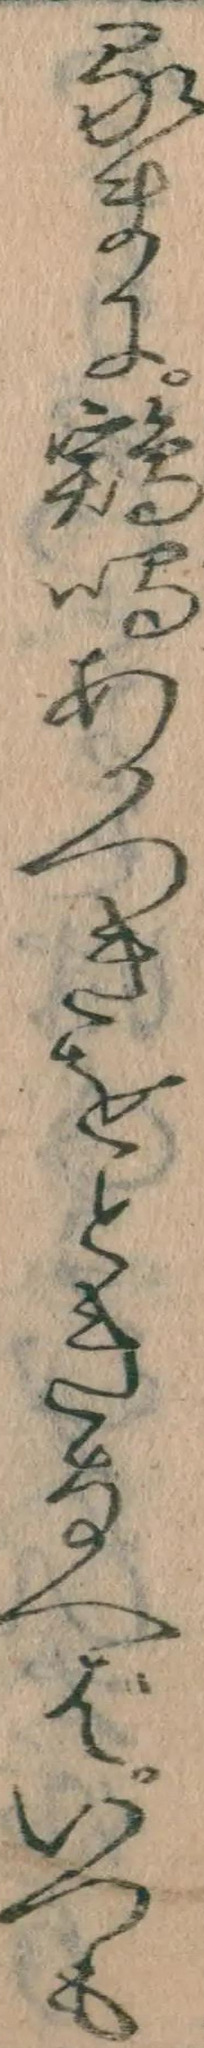るまに。鶏鳴あかつきをときなへば。いつも
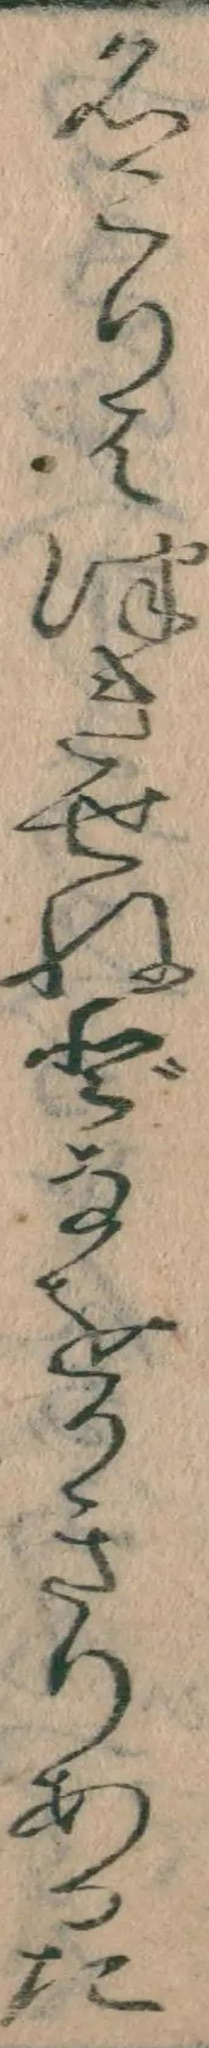名こりはつきせねどなをかきりあるた
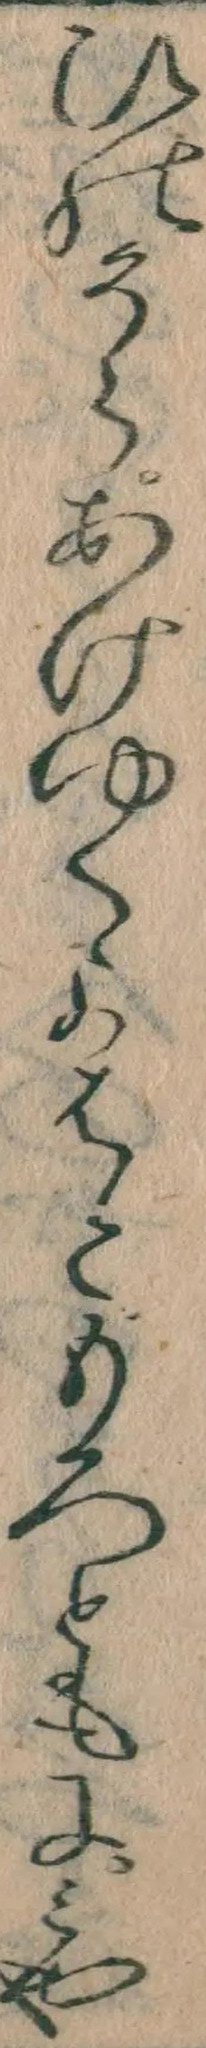ひのそら。あけゆくよはともろともに。みや
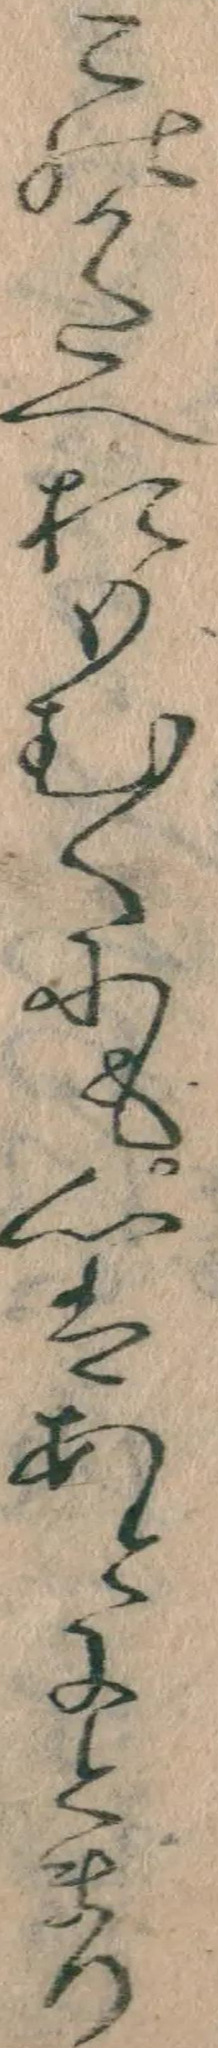このかたへおもむくにも。心はあとにとまり
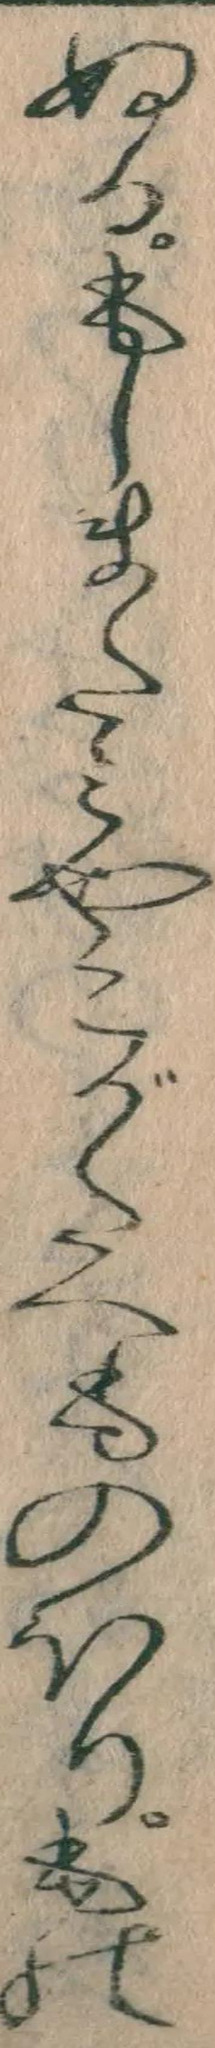ぬる。もしまたみやこがたへものほり。もの
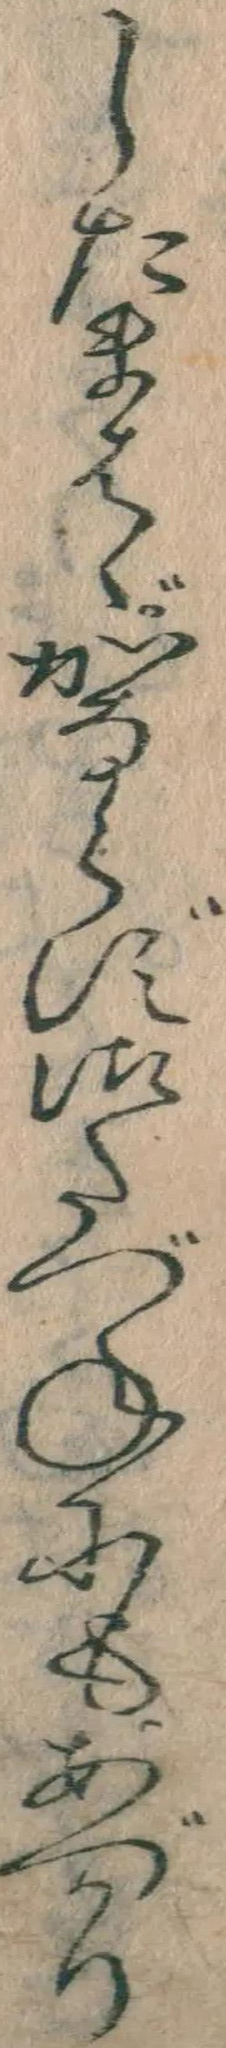したまはゞ。かならず御たづねにも。あづかり
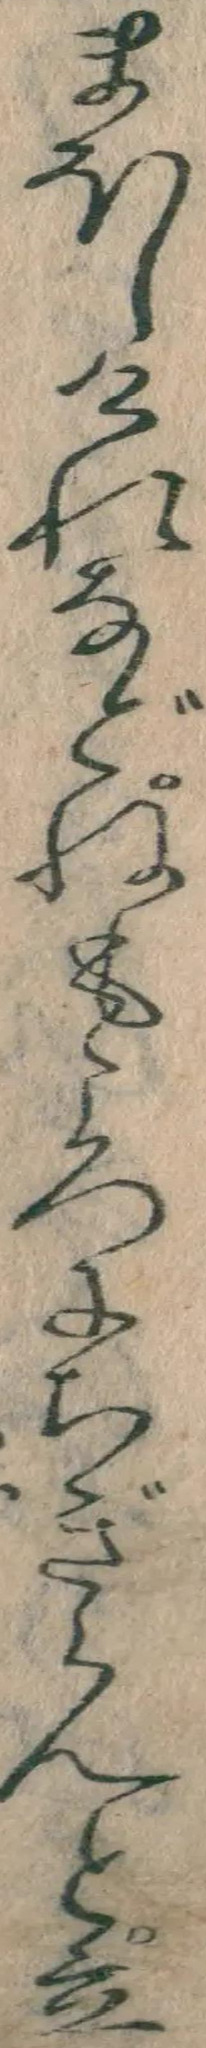まほしけれなど。ねもころにちぎらんと。立
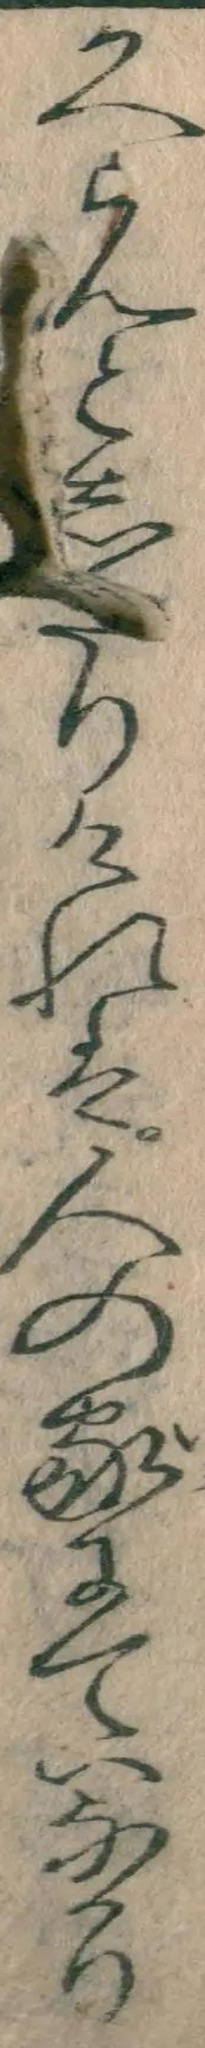かへらんとしたりけれは。人の家にてはなかり
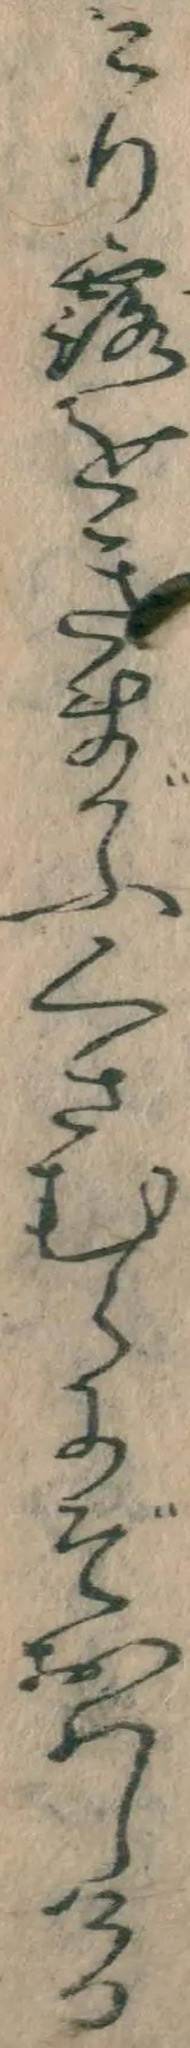けり露をきまがふくさむらにぞおはしける

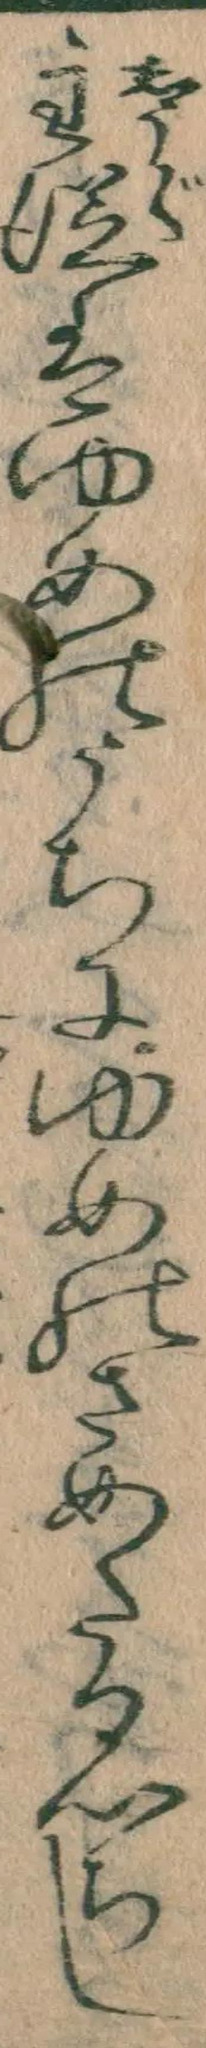主従はゆめのうちに、ゆめのさめたる心ちし
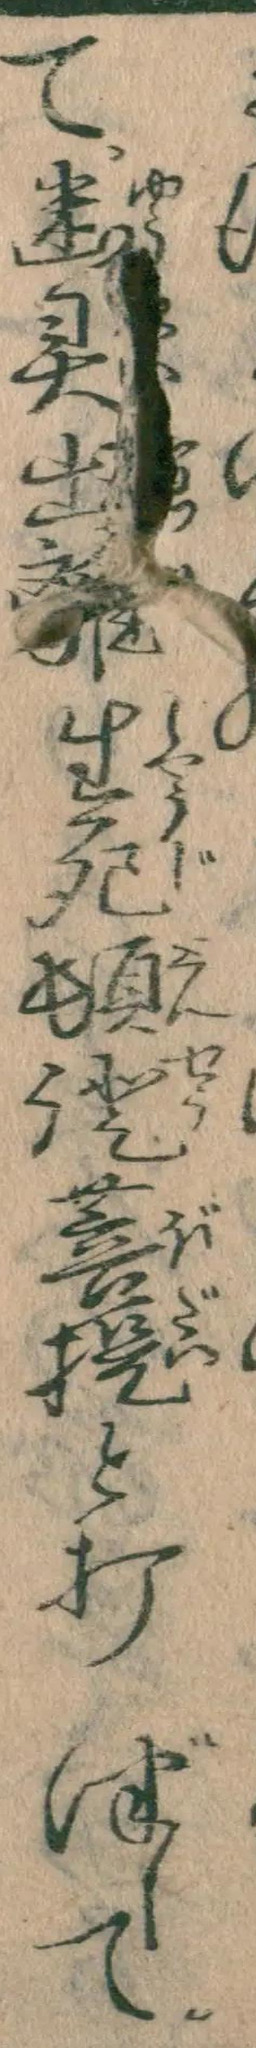て。幽霊出離生死頓証菩提と打づして。
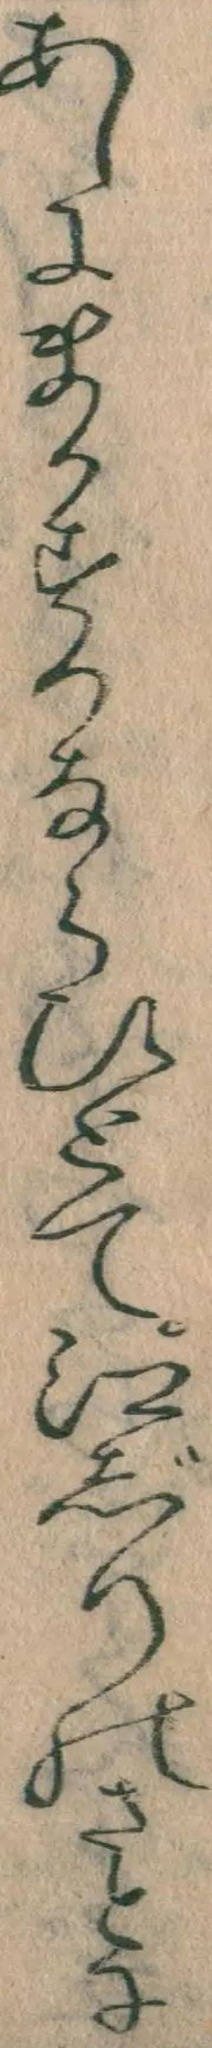あしにまかすかならひとて。江じりのさとに
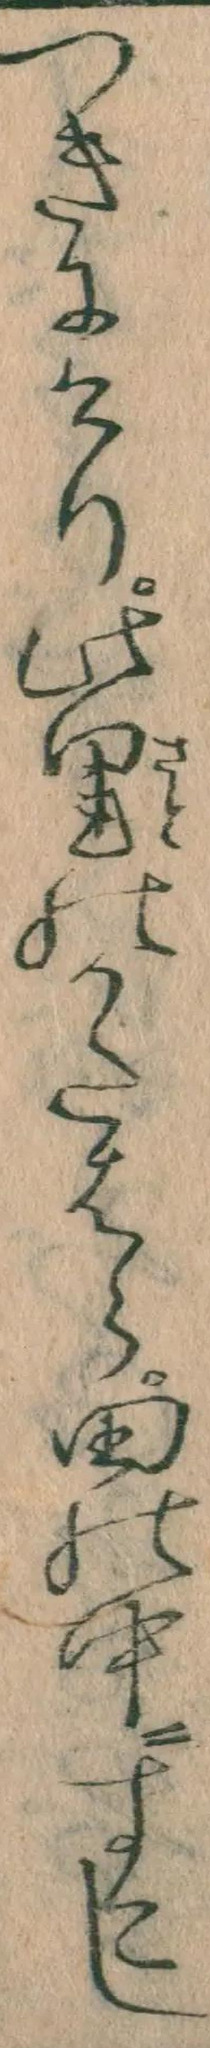つきにけり。此里のかたはら。田の中すこし
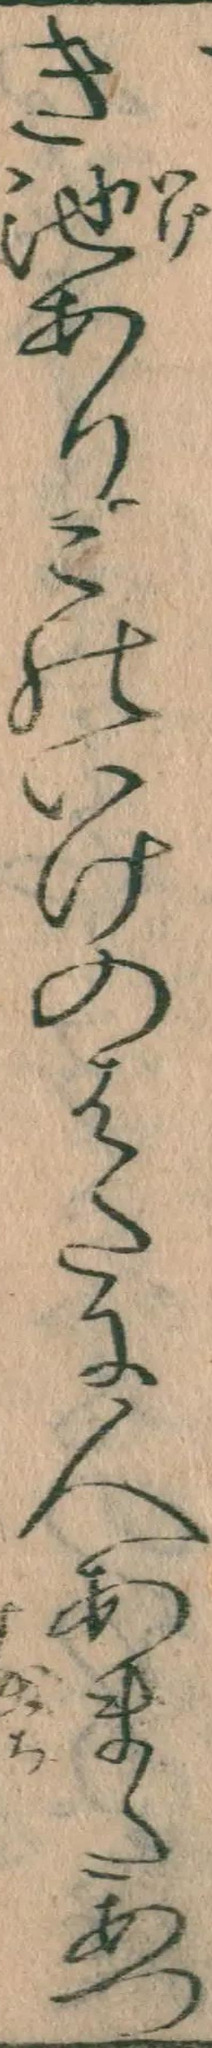き池あり。このいけのはたに人あまたあつ
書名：竹斎狂歌物語 3巻
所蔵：国立国会図書館 National Diet Library, JAPAN
